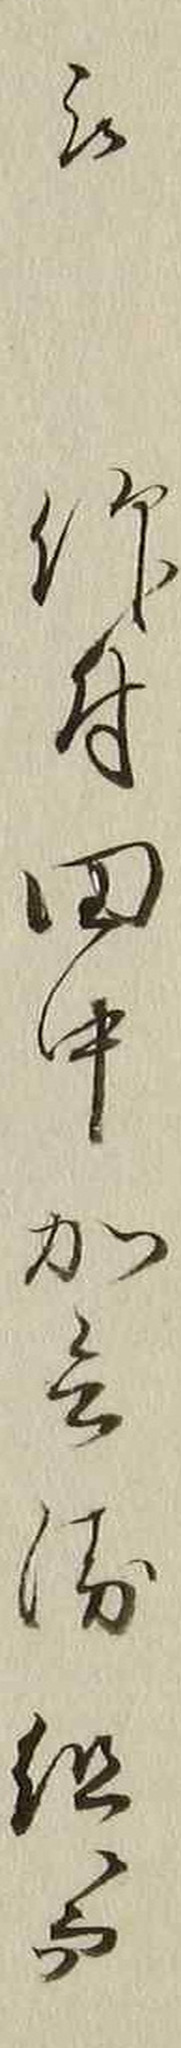被仰付田中加兵衛組ニ而
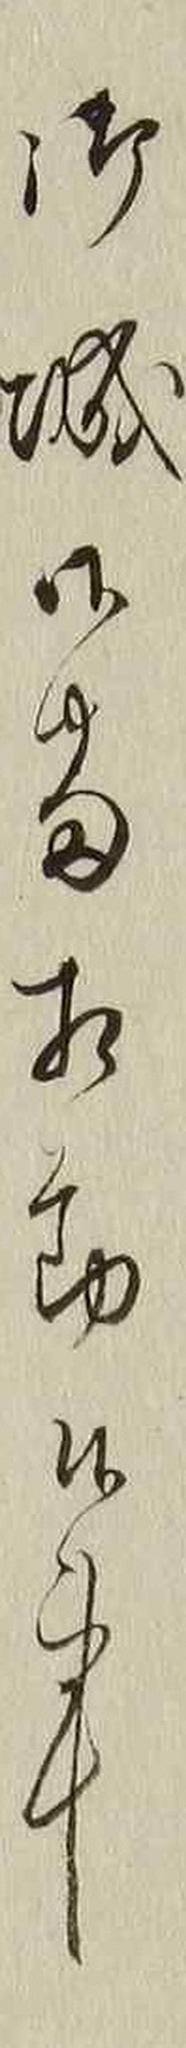御城御番相勤候事
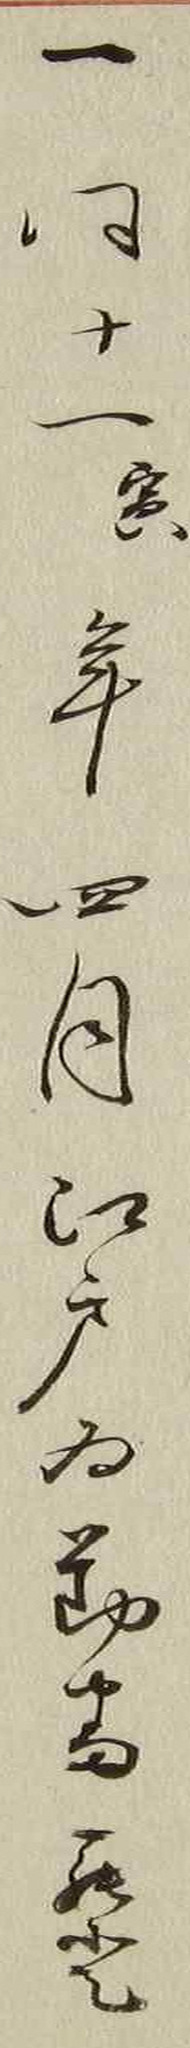一同十一寅年四月江戸為勤番罷登
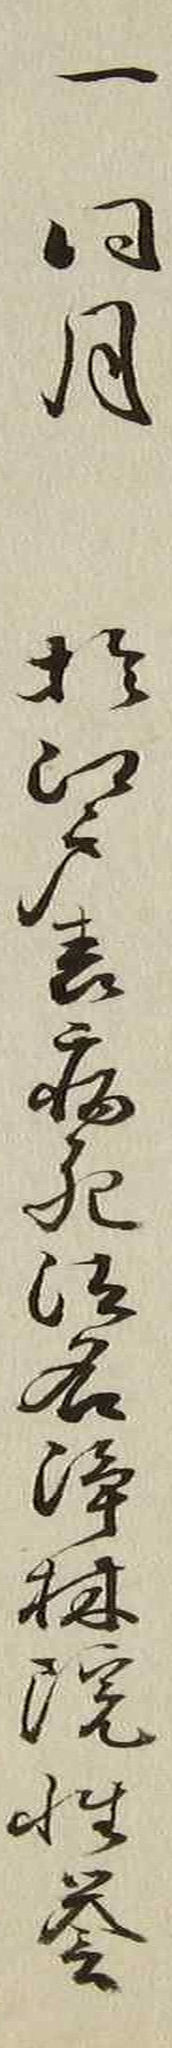一同月於江戸表病死法名浄林院性誉
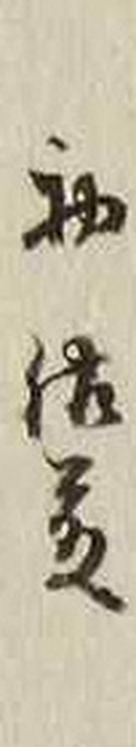初佐藤
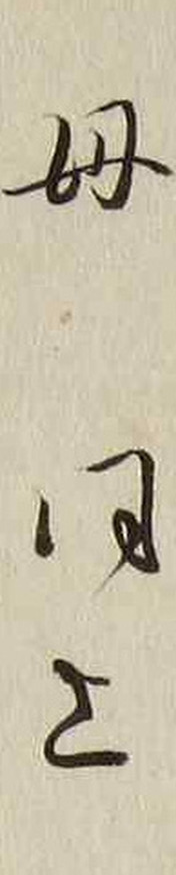母同上
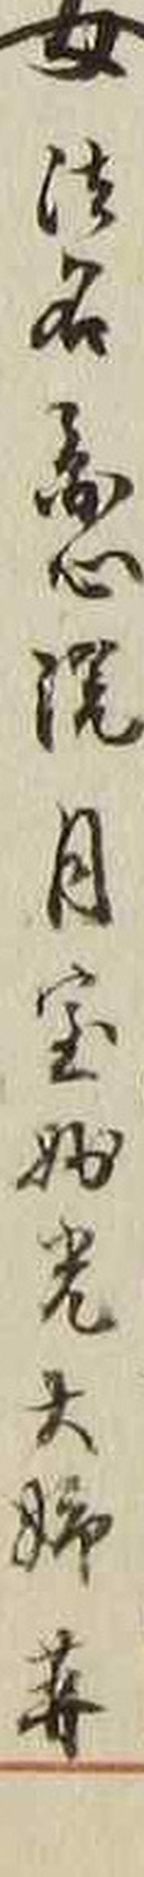法名円心院月宝妙光大姉葬
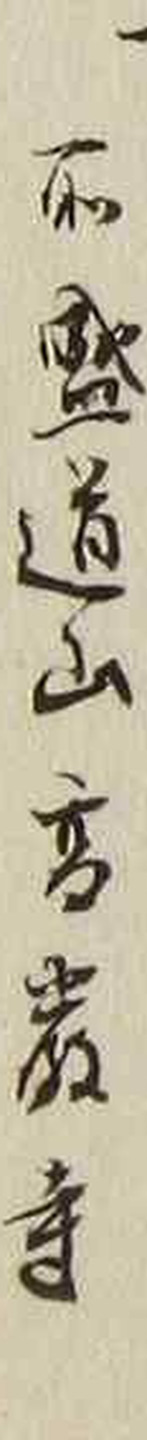所盛道山高厳寺

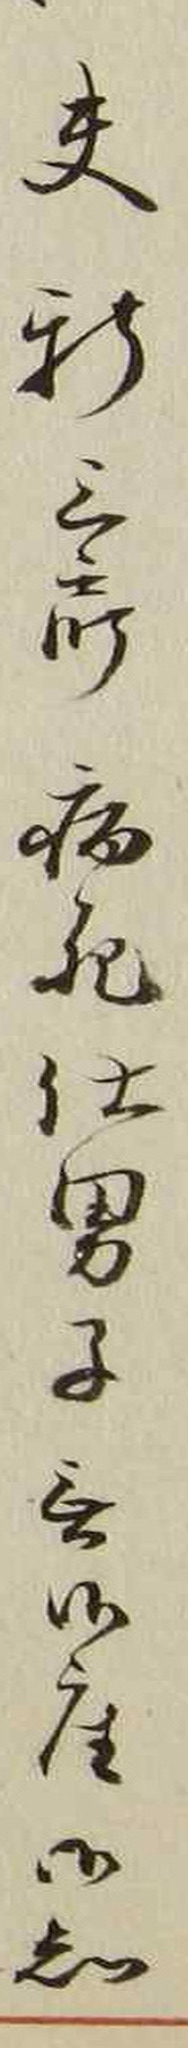不詳夫新三郎病死仕男子無御座御知
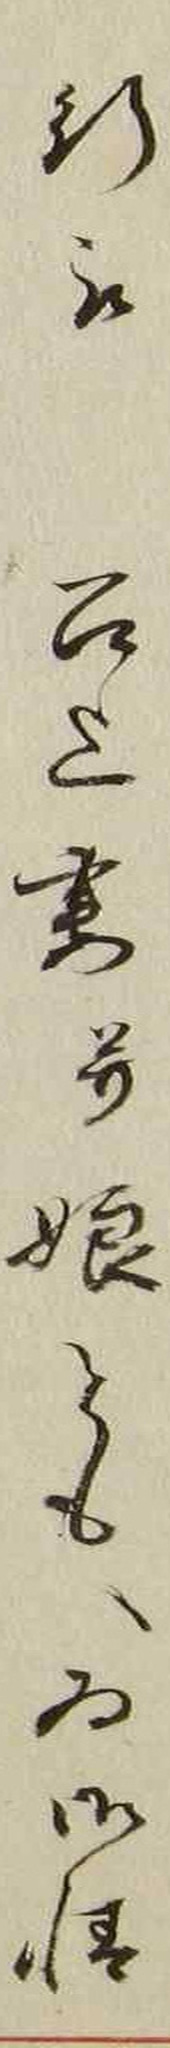行被召上妻并娘ともへ為御情
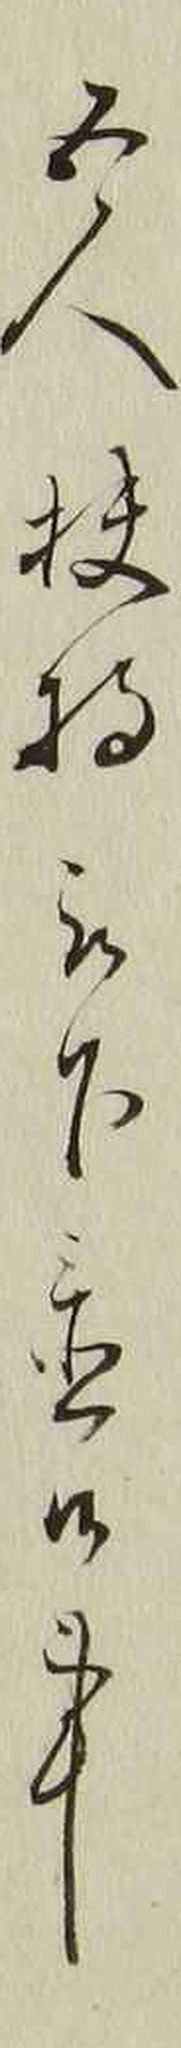五人扶被取下置候事
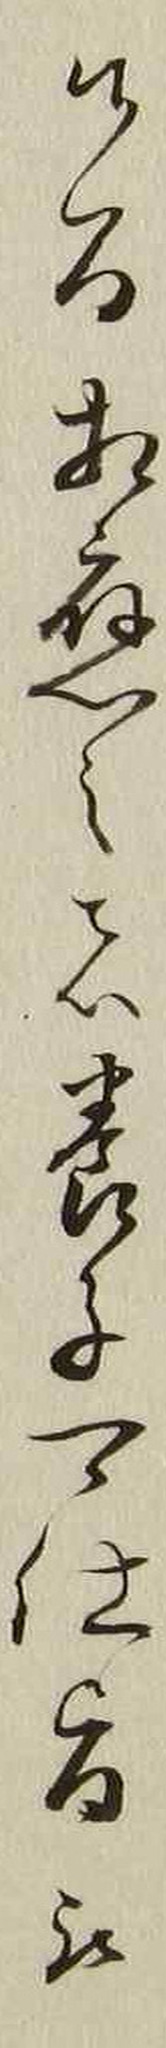候間相応之者養子可仕旨被
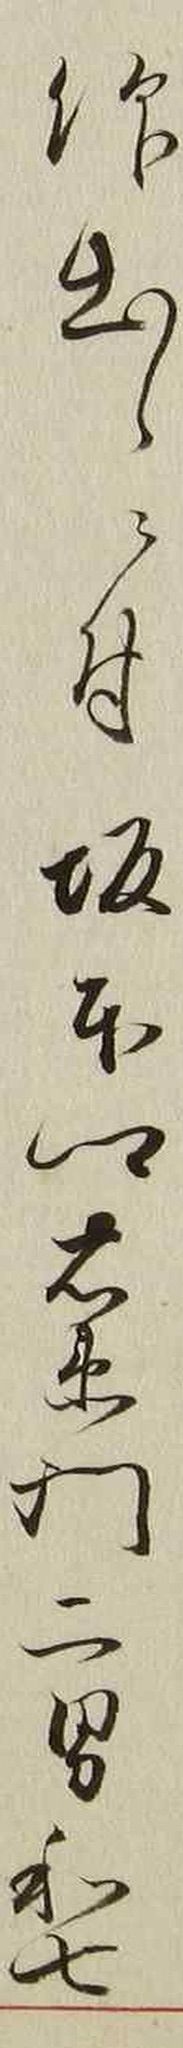仰出候ニ付坂本郷右衛門二男和七
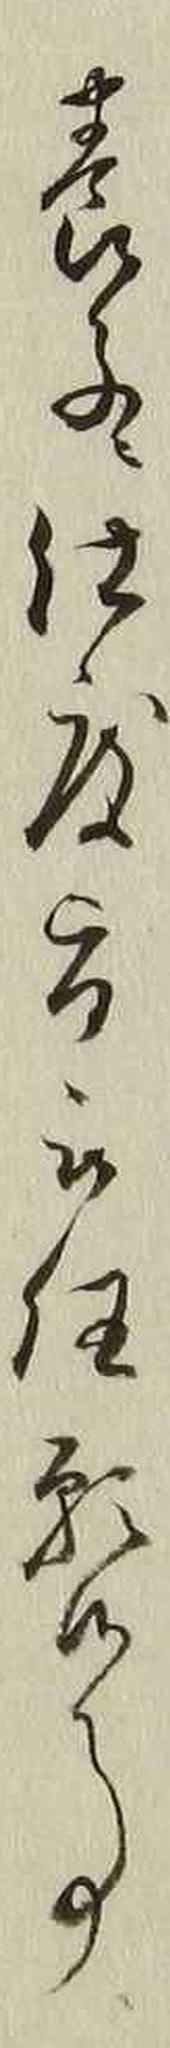養子ニ仕度旨被任願候事
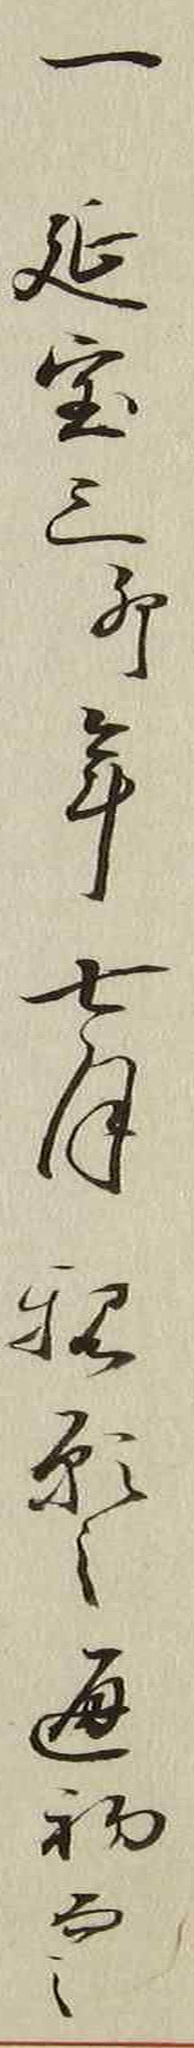一延宝三卯年七月親願之通初而之
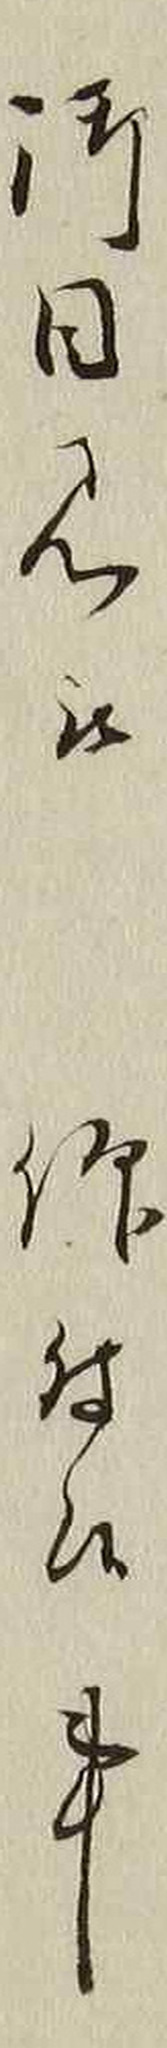御目見被仰付候事
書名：諸士系譜　巻之28　い之部28
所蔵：会津若松市立会津図書館
